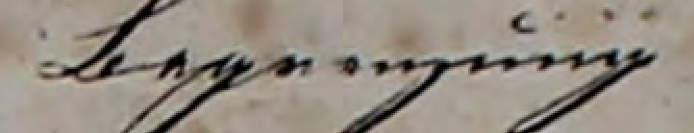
Begrenzung
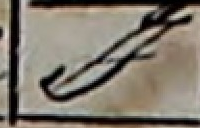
J.
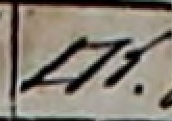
Ck.
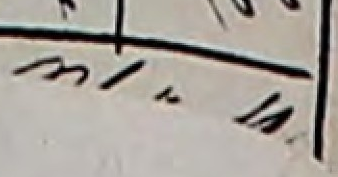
???
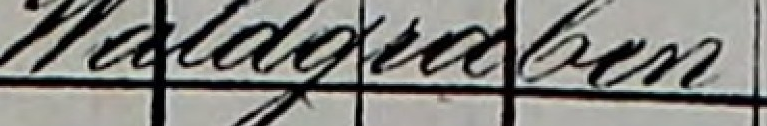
Waldgraben
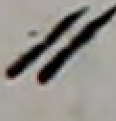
11
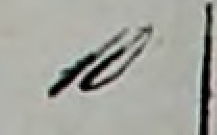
23
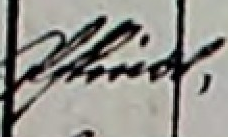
Pflinds„
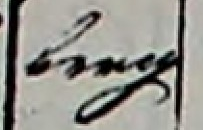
berg
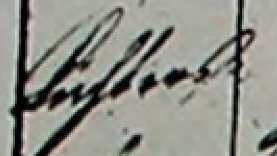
Lichters„
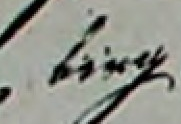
berg
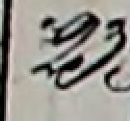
23
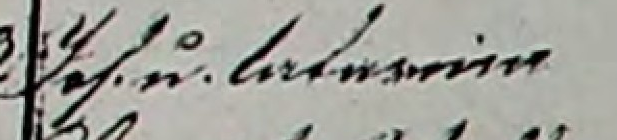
Jos. u. Catarina
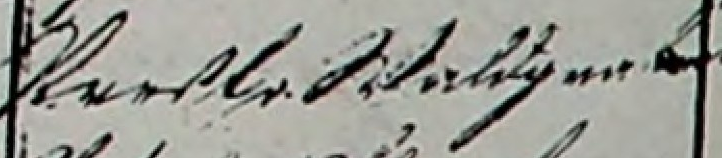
Presl v. Waldgraben
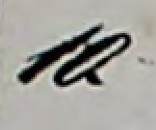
10
